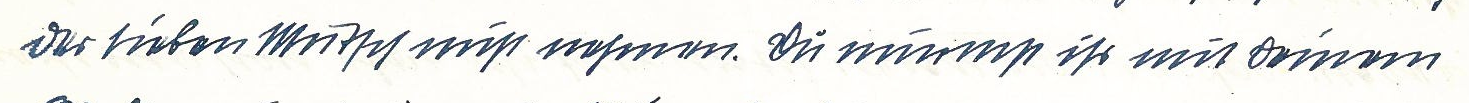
der lieben Mutsch nicht nehmen. Du nimmst ihr mit Deinem
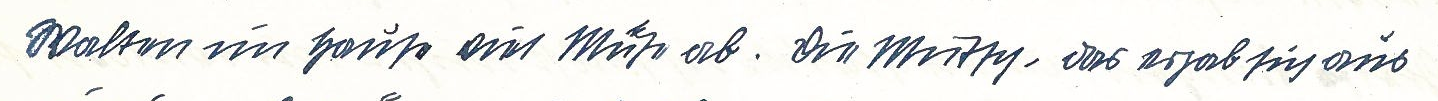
Walten im Hause viel Mühe ab. Die Mutsch, das ergab sich aus
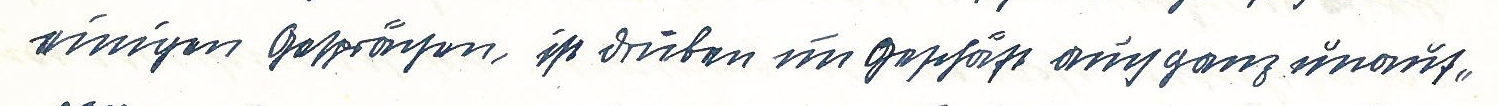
einigen Gesprächen, ist drüben im Geschäft auch ganz unauf¬
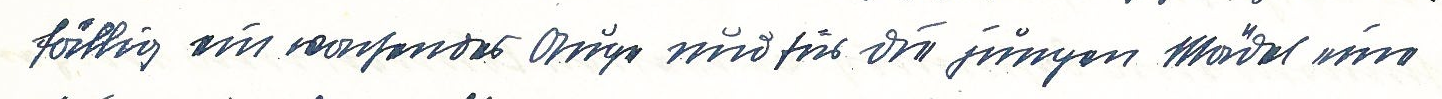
fällig ein wachendes Auge und für die jungen Mädel eine
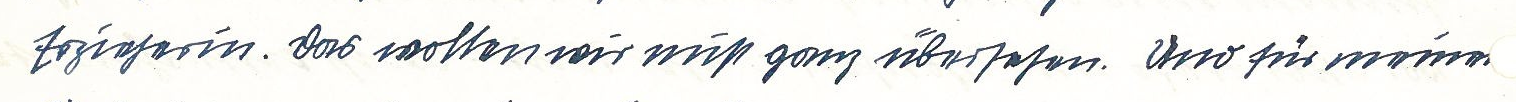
Erzieherin. Das wollen wir nicht ganz übersehen. Und für meine
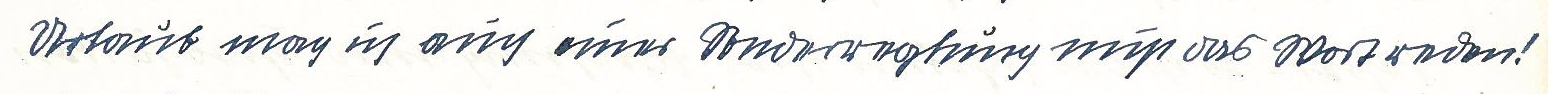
Urlaub mag ich auch einer Sonderregelung nicht das Wort reden!
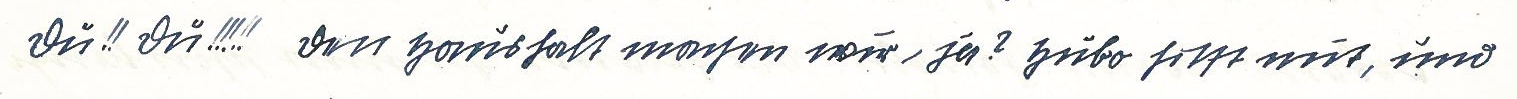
Du!! Du!!! Den Haushalt machen wir, ja? Hubo hilft mit, und
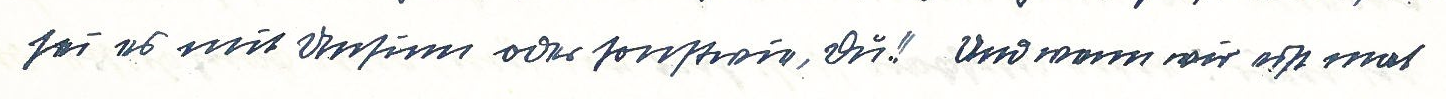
sei es mit Unsinn oder sonstwie, Du!! Und wenn wir erst mal
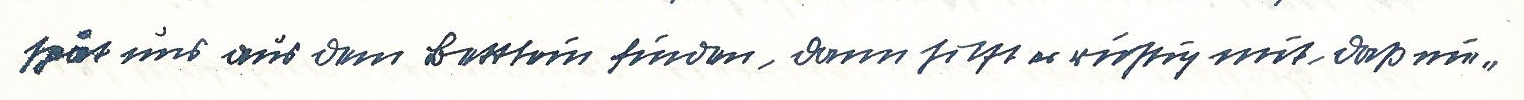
spät uns aus dem Bettlein finden, dann hilft er richtig mit, daß nie¬
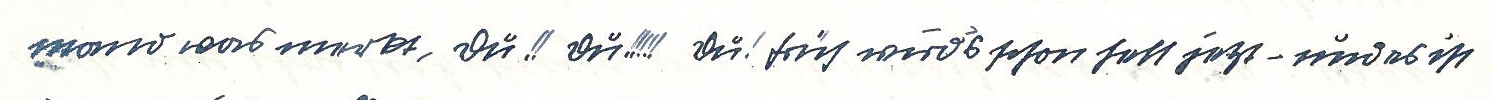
mand was merkt, Du!! Du!!!!! Du! Früh wird’s schon hell jetzt – und es ist
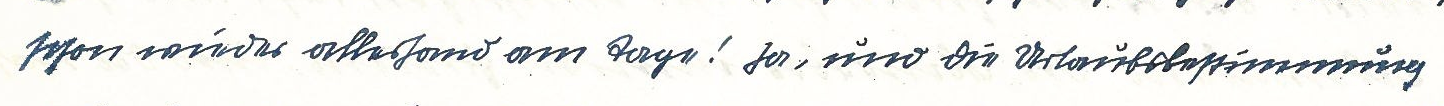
schon wieder allerhand am Tage! Ja, und die Urlaubsbestimmung
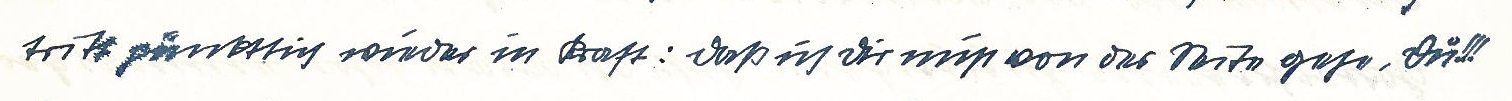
tritt pünktlich wieder in Kraft: daß ich Dir nicht von der Seite gehe, Du!!!
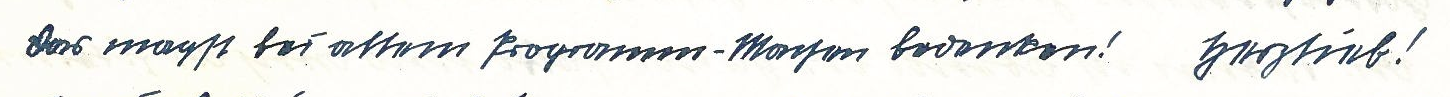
das magst bei allem Programm–Machen bedenken! Herzlieb!
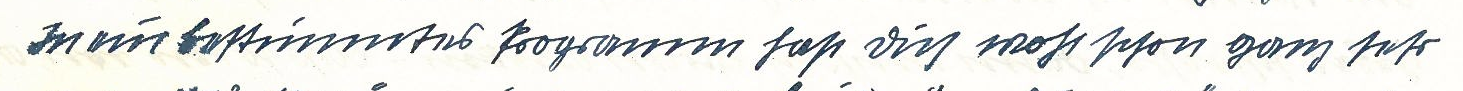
In ein bestimmtes Programm hast Dich wohl schon ganz sehr
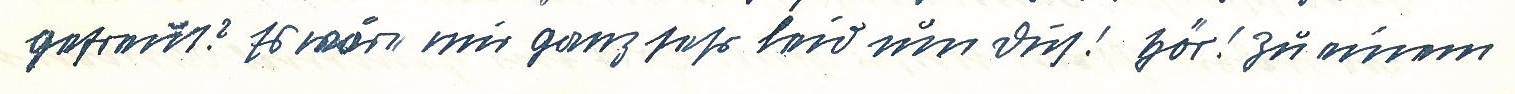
gefreut? Es wäre mir ganz sehr leid um Dich! Hör! Zu einem
